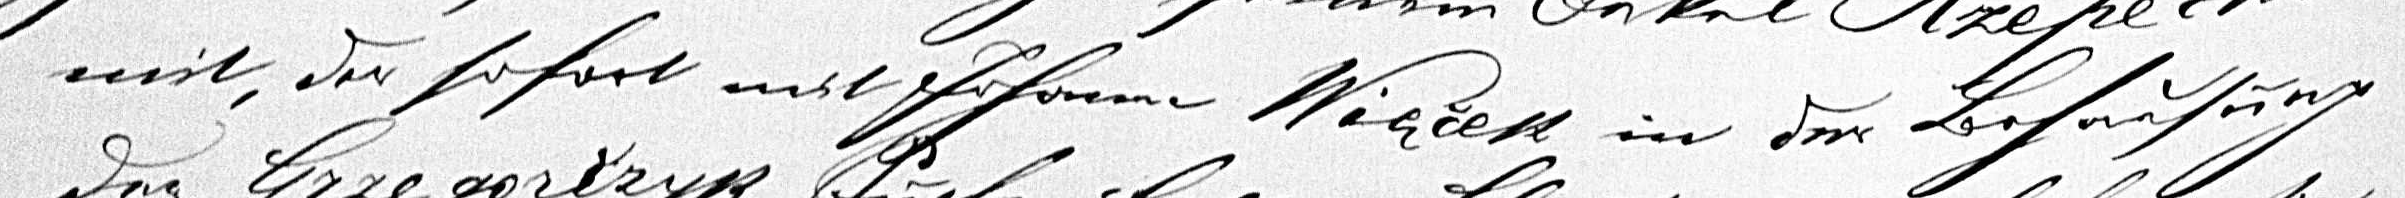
mit, da sofort mit Johann Wiącek in der Behausung
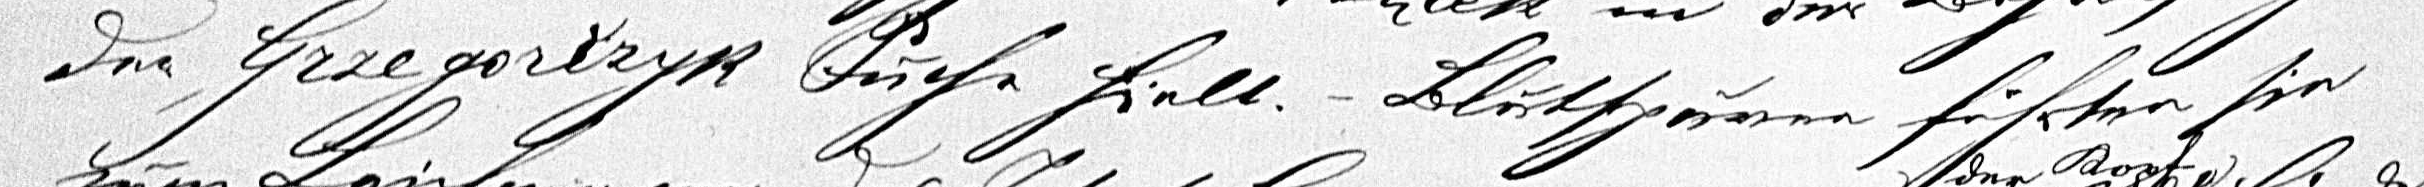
der Grzegorczyk Sache hielt. Blutspuren führten sie
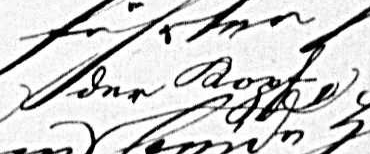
der Kopf
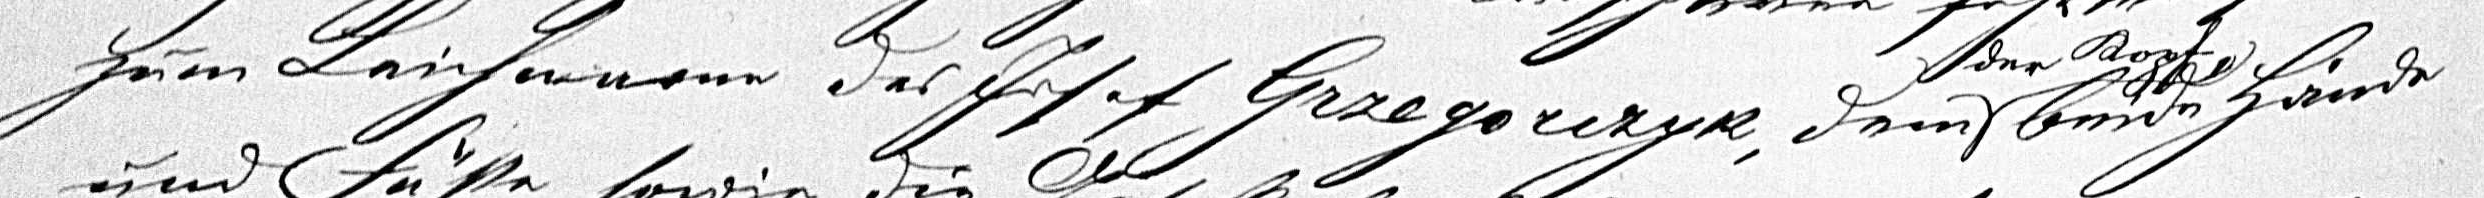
zum Leichname der Josef Grazegorczyk, dem beide Hände
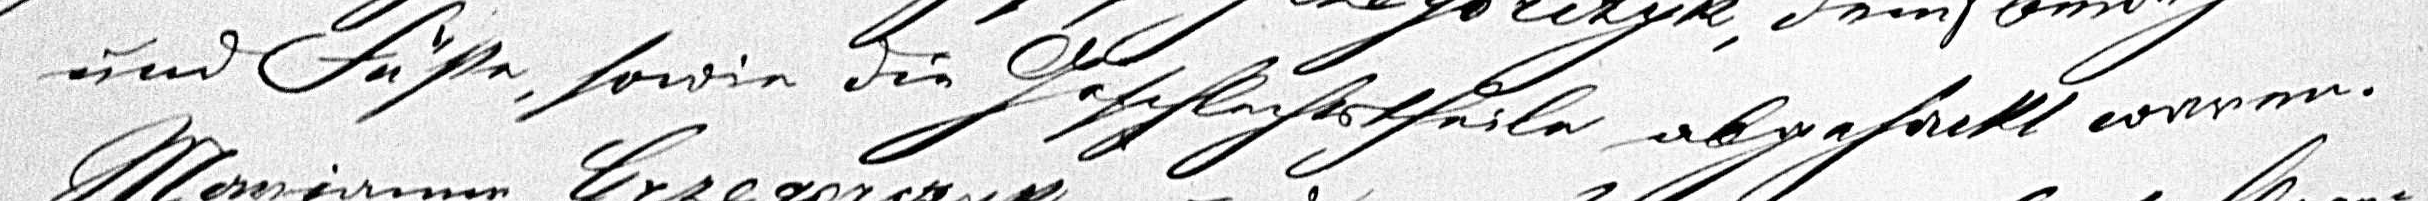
und Füße, sowie die Geschlechtstheile abgehackt waren.
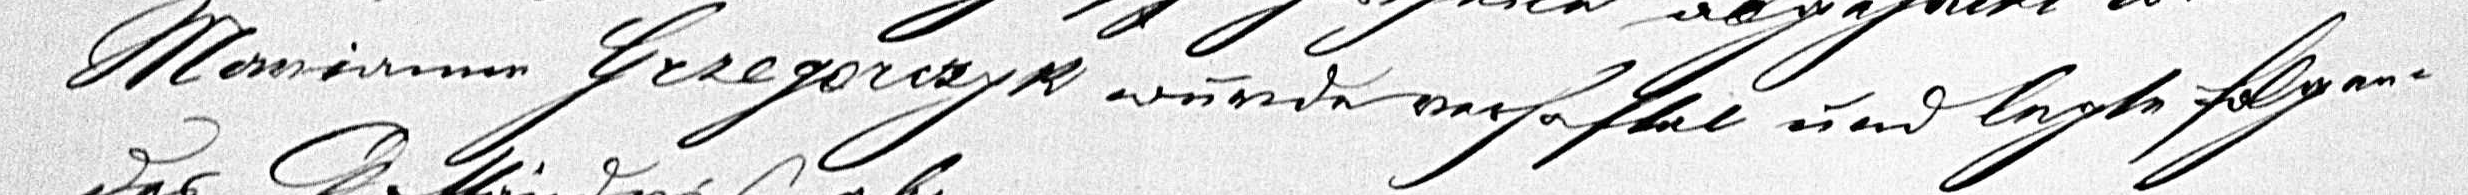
Marianne Grzegorczyk wurde verhaftet und legte folgen¬
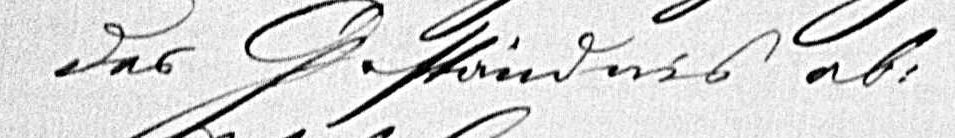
des Geständnis ab:
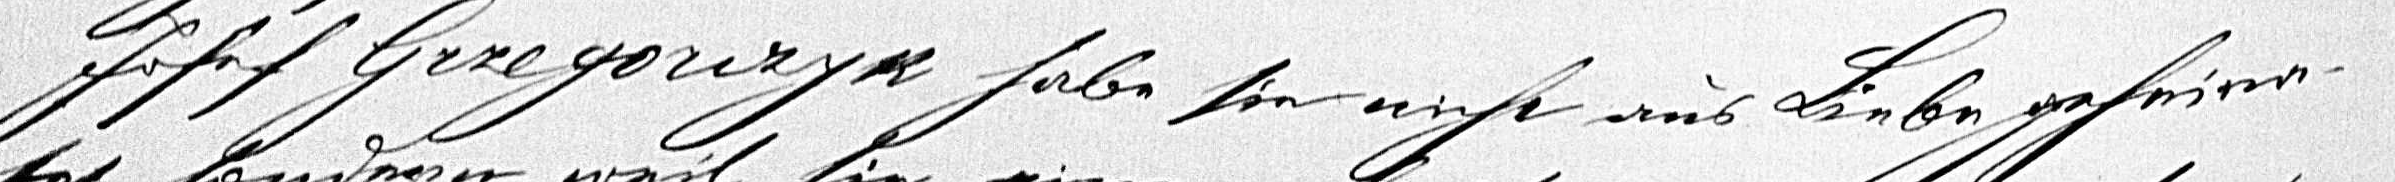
Josef Grzegorczyk habe sie nicht aus Liebe geheira¬
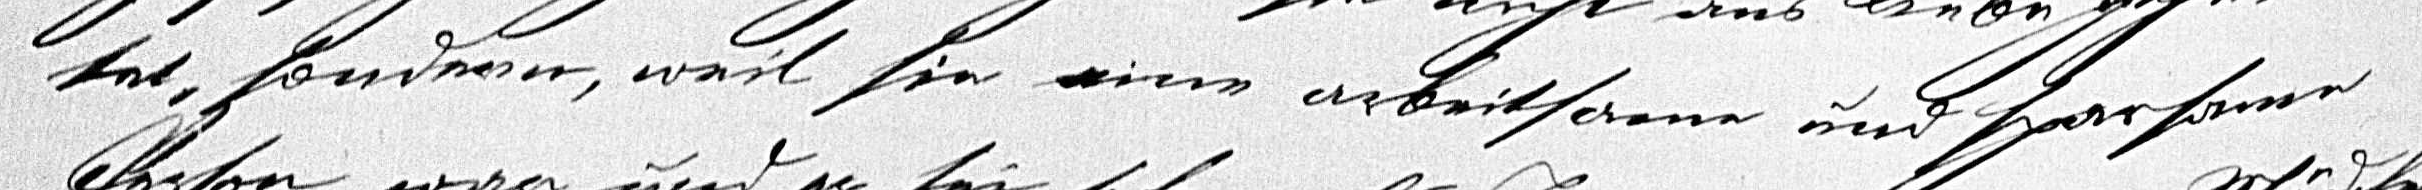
tet, sondern, weil sie eine arbeitsame und sparsame
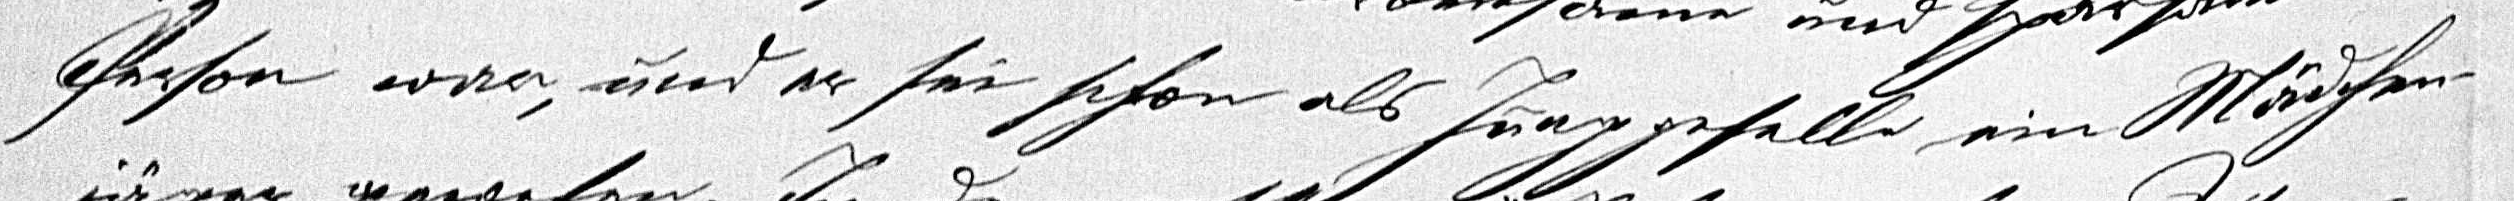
Person war, und er sei schon als Junggeselle ein Mädchen¬
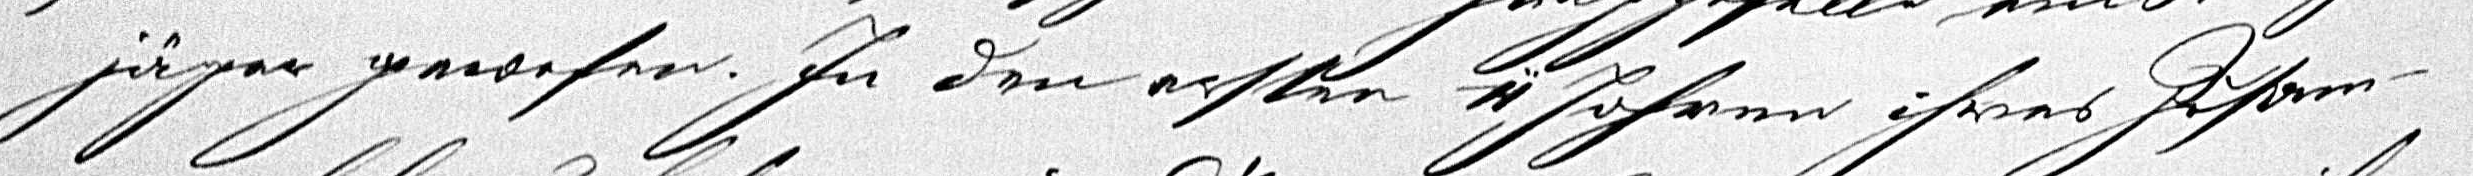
jäger gewesen. In den ersten 11 Jahren ihres Zusam¬
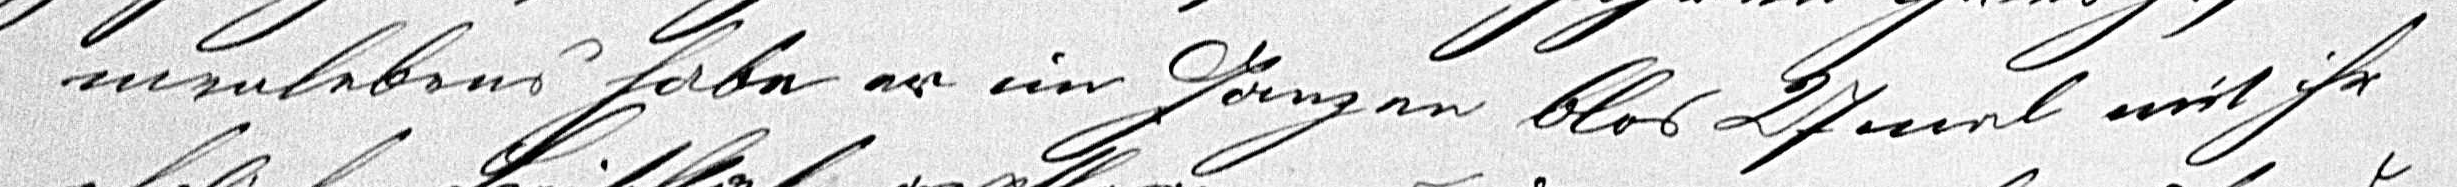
menlebens habe er im Ganzen blos 27 mal mit ihr
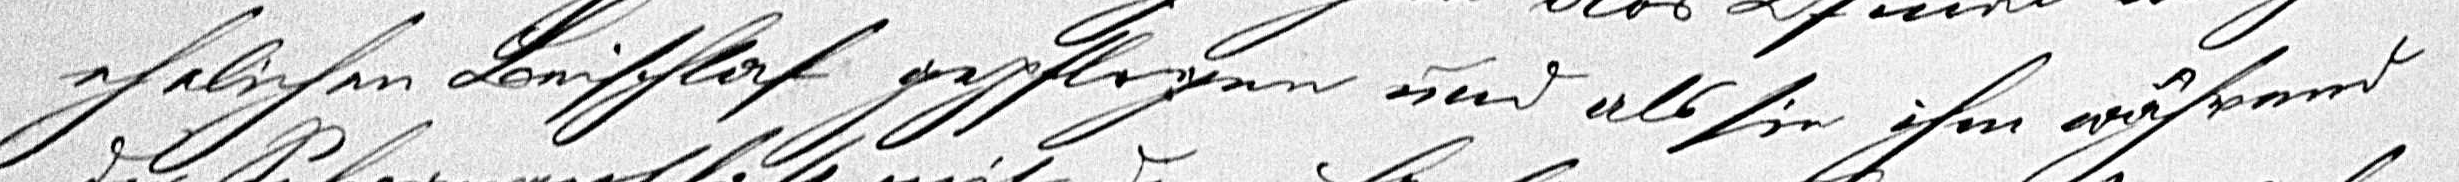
ehelichen Beischlaf gepflogen und als sie ihm während
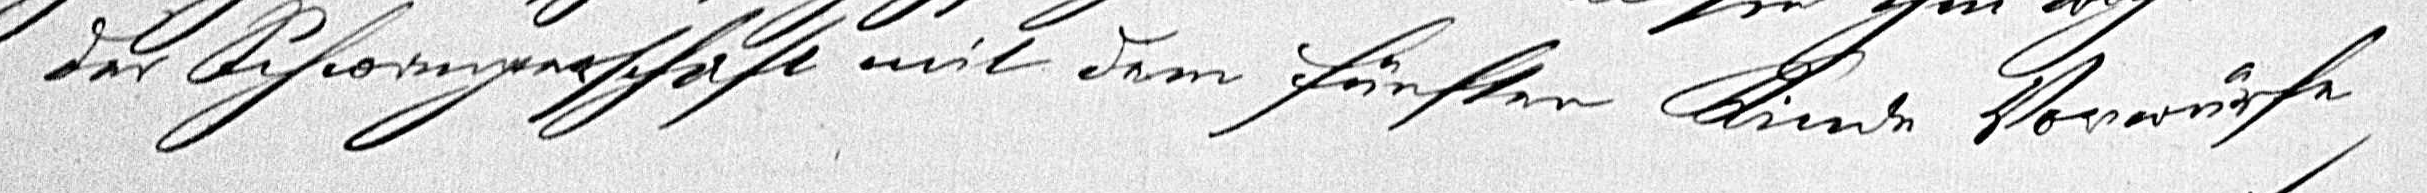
der Schwangerschaft mit dem fünften Kinde Vorwürfe
